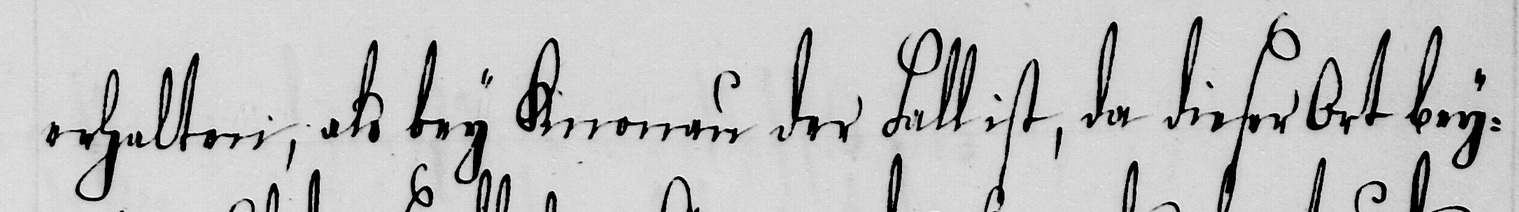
rhalten, als bey Knonau der Fall ist, da die¬
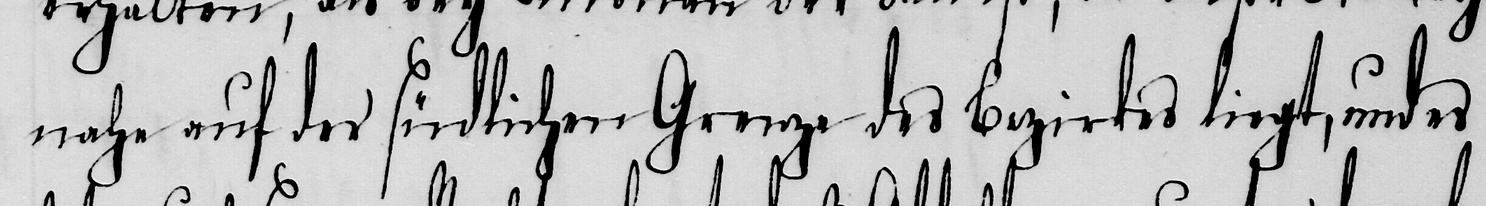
nahe auf der südlichen Grenze des Bezirkes liegt, und
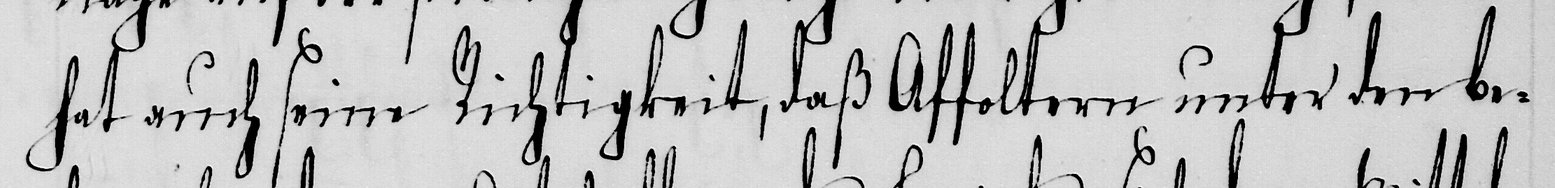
hat auch seine Richtigkeit, daß Affoltern unter den be¬
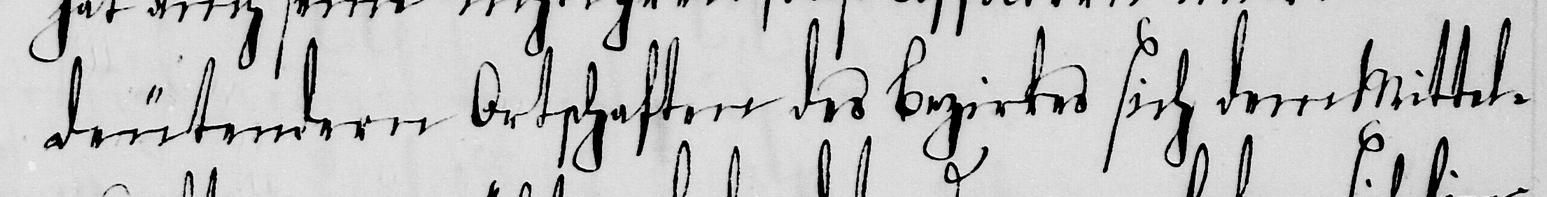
deutendern Ortschaften des Bezirkes sich dem Mittel¬
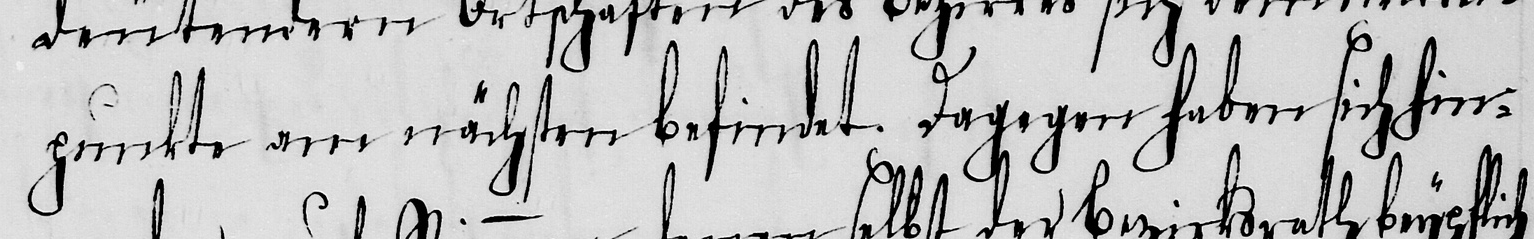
punkte am nächsten befindet. Dagegen haben sich hin¬
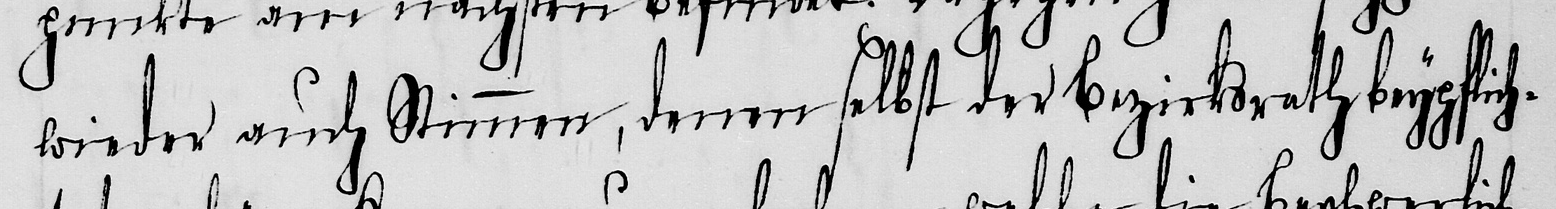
wieder auch Stimmen, denen selbst der Bezirksrath beypflic¬
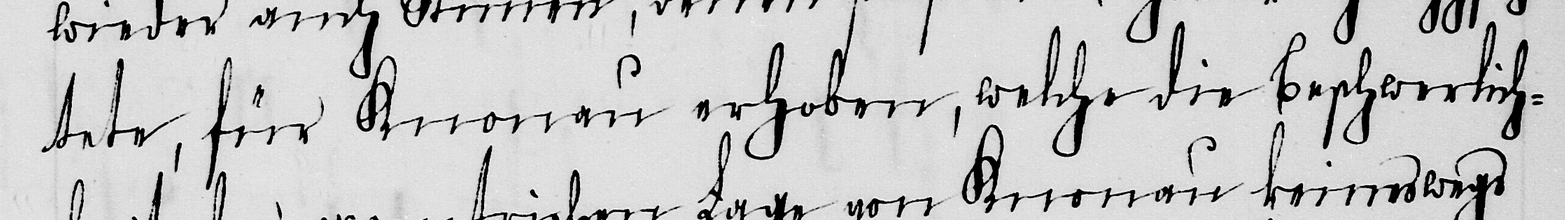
htete, für Knonau erhoben, welche die Beschwerlich¬
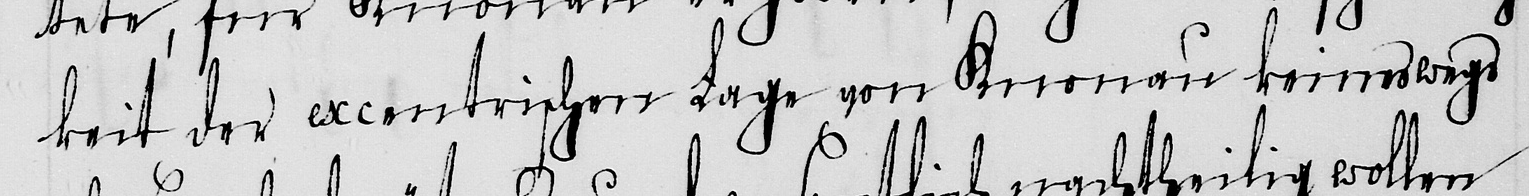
keit der excentrischen Lage von Knonau keineswegs
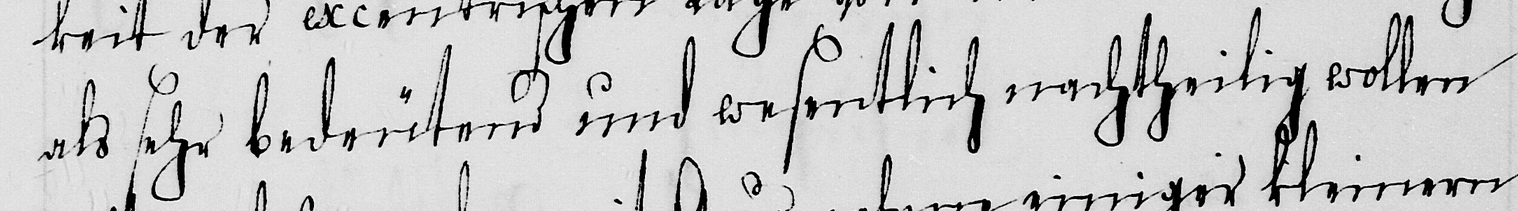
als sehr bedeutend und wesentlich nachtheilig wollen
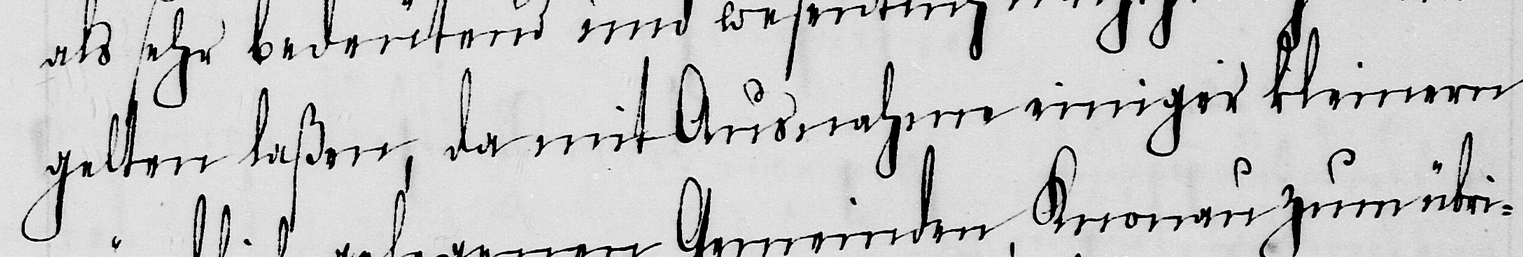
gelten laßen, da mit Ausnahme einiger kleinern
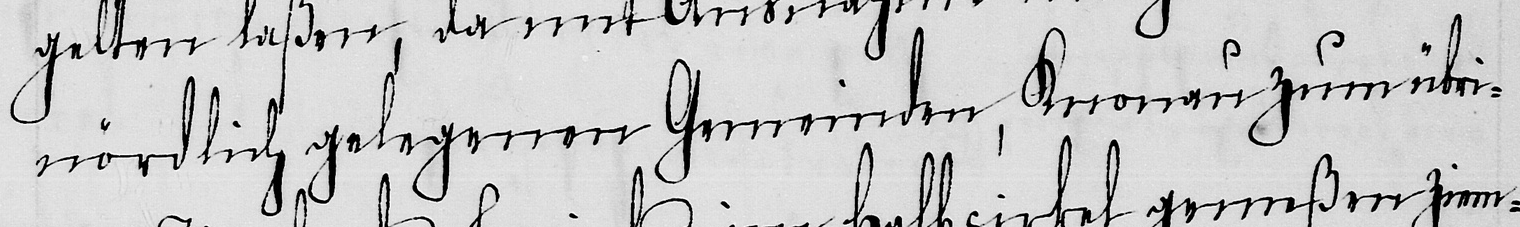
nördlich gelegenen Gemeinden, Knonau zum übri¬
